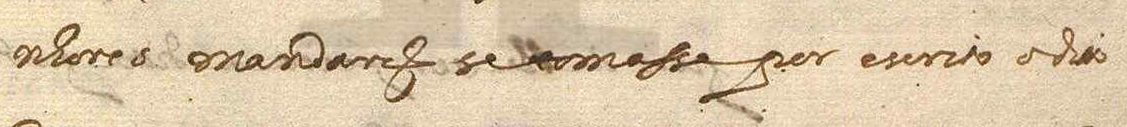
nhores mandaraõ se tomasse por escrito o ditto
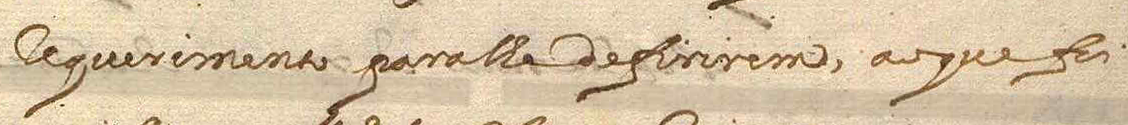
Requerimento para lhe defirirem, ao que foi
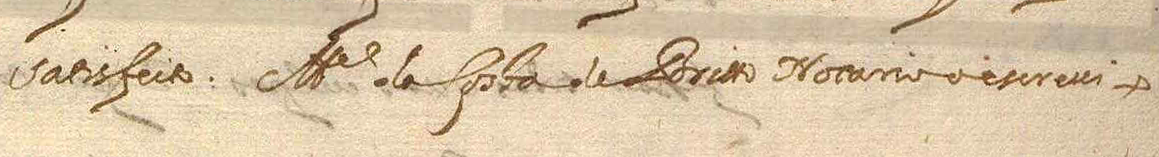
satisfeito. Mel da Costa de Britto Notario o escreui
